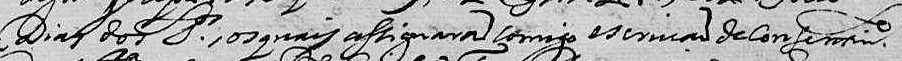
Dias dos S.tos, os quais assignaraõ comigo escriuaõ de consentim.to
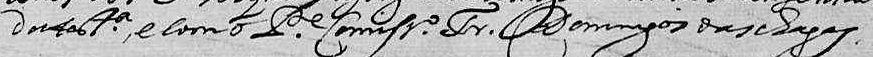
da test.a, e com o P.e Comisr.o Fr. Domingos das chagas
